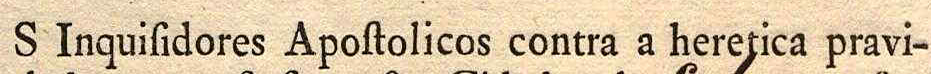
S Inquisidores Apostolicos contra a heretica pravi
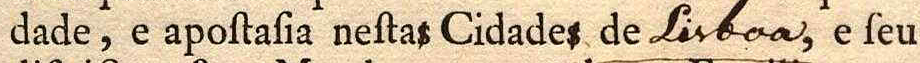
dade, e apostasia nestas Cidades de Lisboa, e seu
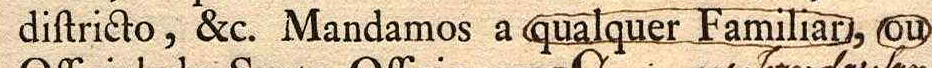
districto, &c. Mandamos a qualquer Familiar, ou
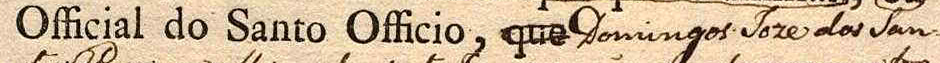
Official do Santo Officio, que Domingos Ioze dos San
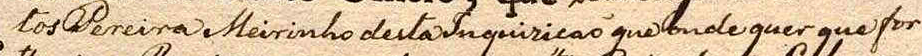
tos Pereira Meirinho desta Inquiziçaõ que onde quer que for
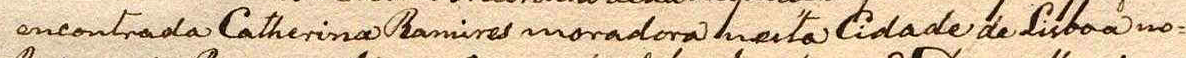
encontrada Catherina Ramires moradora nesta Cidade de Lisboa no
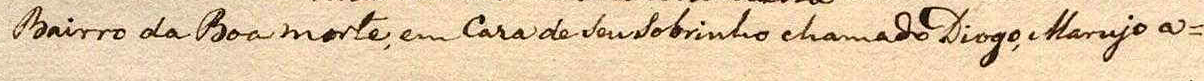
Bairro da Boa morte, em Caza de seu sobrinho chamado Diogo, Marujo a
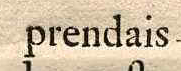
prendais
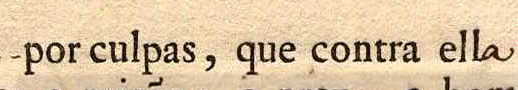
por culpas, que contra ella
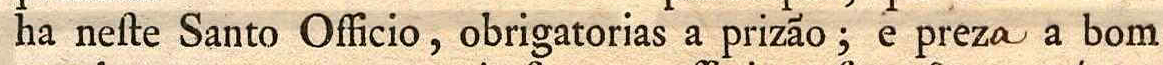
ha neste Santo Officio, obrigatorias a prizão; e preza a bom
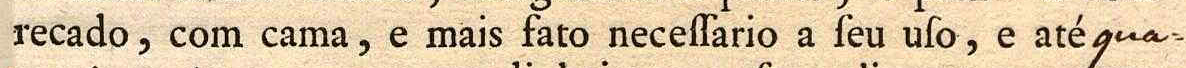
recado, com cama, e mais fato necessario a seu uso, e até qua
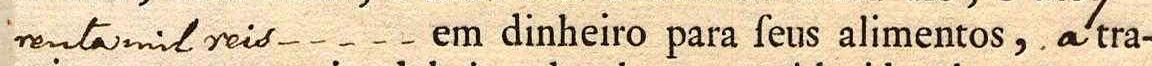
renta mil reis em dinheiro para seus alimentos, a tra
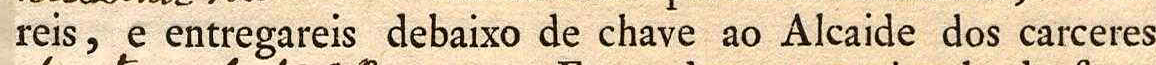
reis, e entregareis debaixo de chave ao Alcaide dos carceres
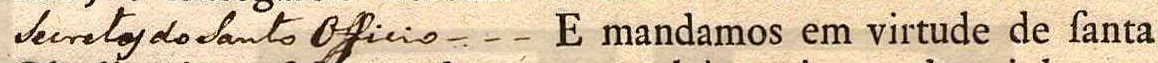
secretos do Santo Officio E mandamos em virtude de santa
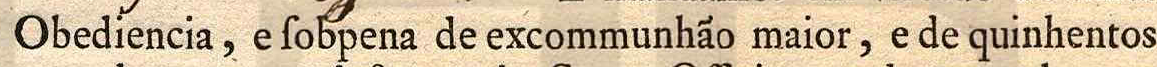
Obediencia, e sobpena de excommunhão maior, e de quinhentos
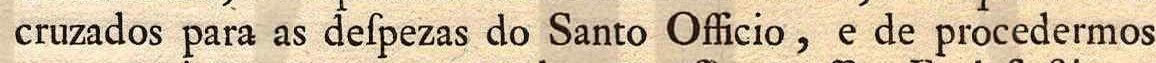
cruzados para as despezas do Santo Officio, e de procedermos
